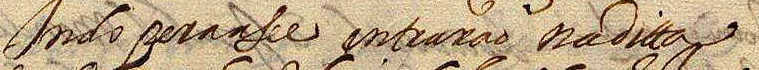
Indo pera a see, entraraõ na ditta
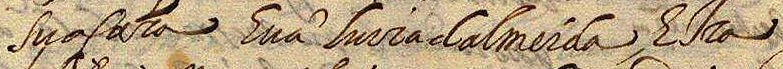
sua Caza huā Luiza dalmeida, e Iza
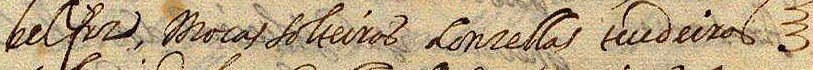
bel frz, mocas solteiras donzellas tecedeiras
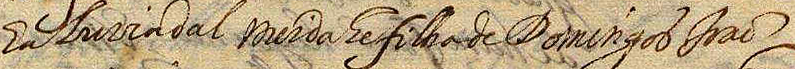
e a Luiza dalmeida he filha de Domingos Joaõ
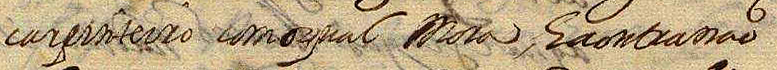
carpinteiro com o qual mora, e a outra naõ
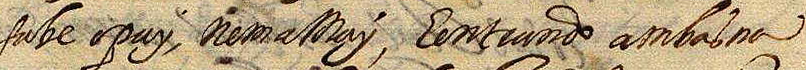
sabe o pay, nem a May, e entrando ambas
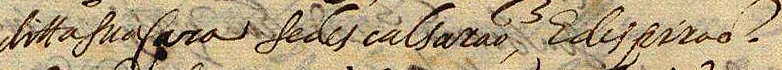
na ditta sua Caza se descalsaraõ, e despiraõ
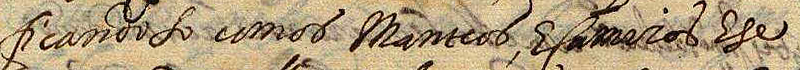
ficando so com os Manteos, e Camizas e se
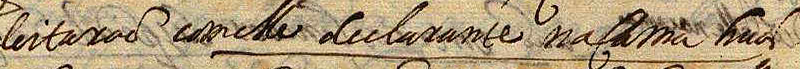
deitaraõ com elle declarante na Cama huā
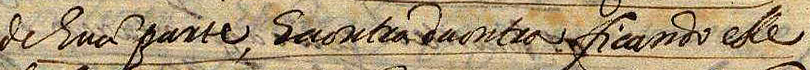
de huā parte, e a outra da outra ficando elle
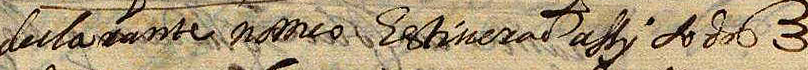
declarante no meo e estiveraõ assy todos
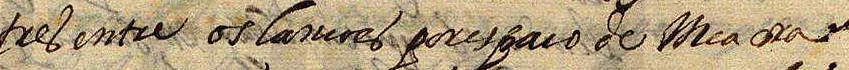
tres entre os lançoes por espaço de mea ora
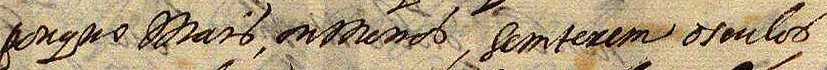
pouquo mais, ou menos, sem terem osculos
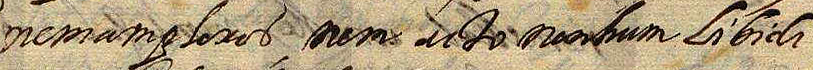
nem amplexos nem acto nenhum libidi
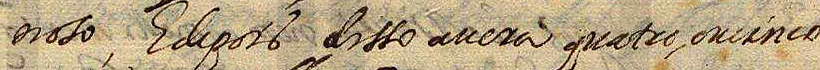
noso, e depois disso auera quatro ou cinco
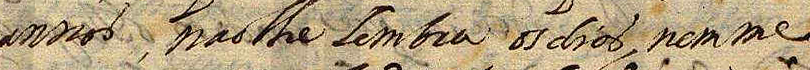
annos, naõ lhe lembra os dias, nem me
